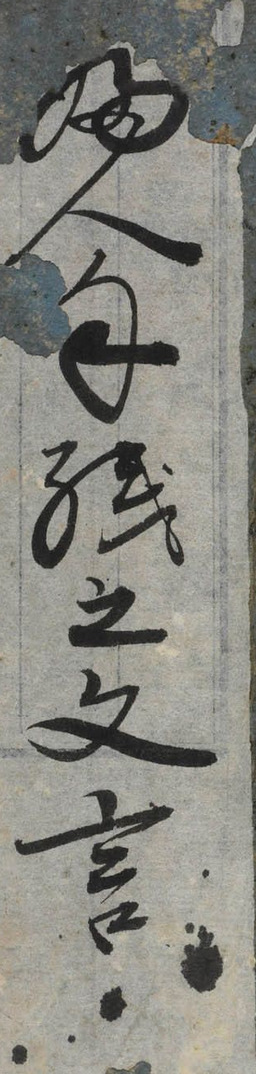婦人手紙之文言

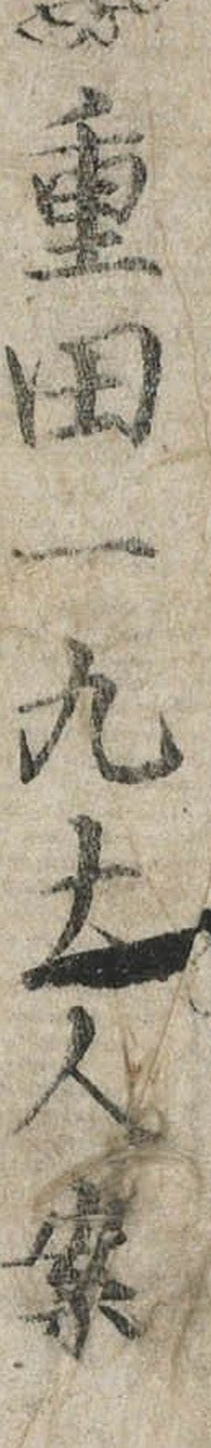重田一九大人案
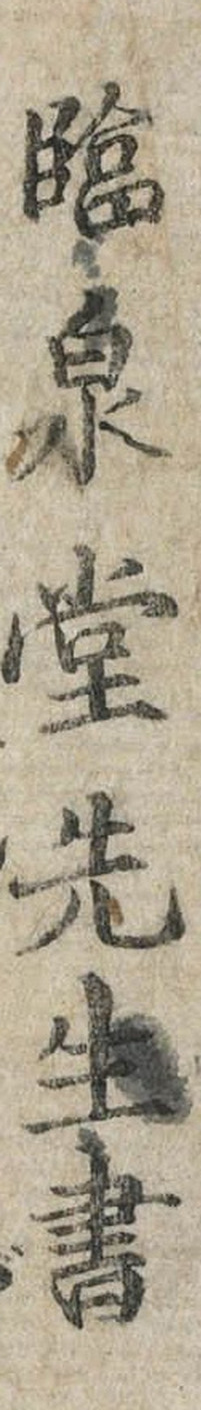臨泉堂先生書
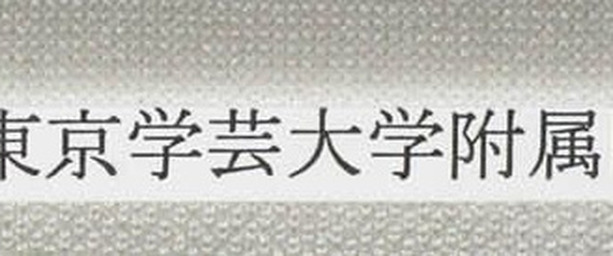東京学芸大学蔵書
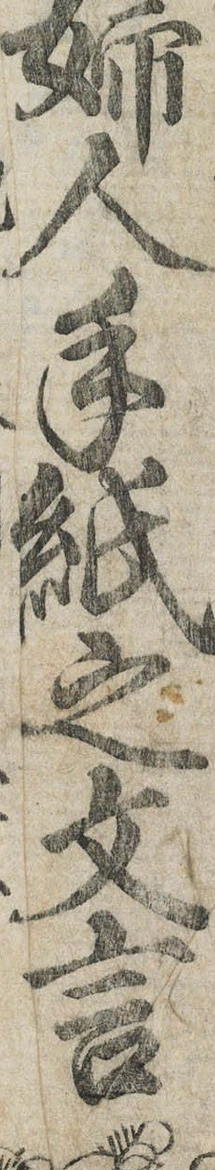婦人手紙之文言叙
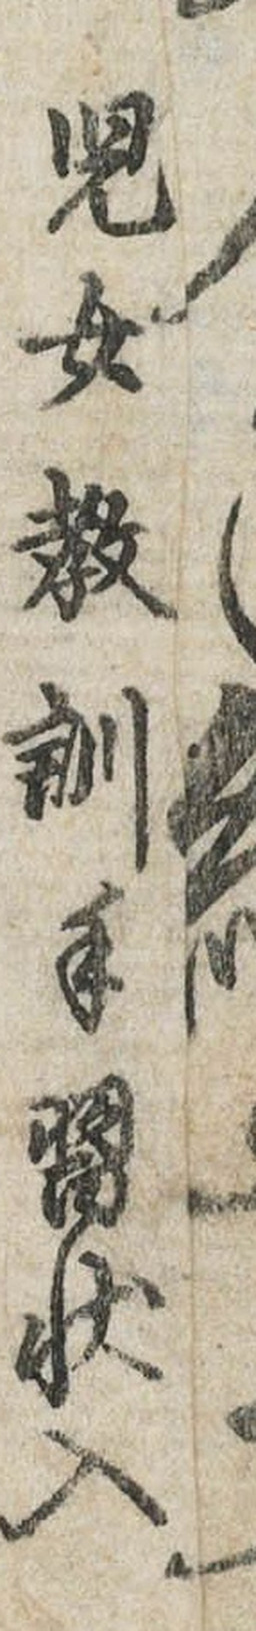児女教訓手習状入
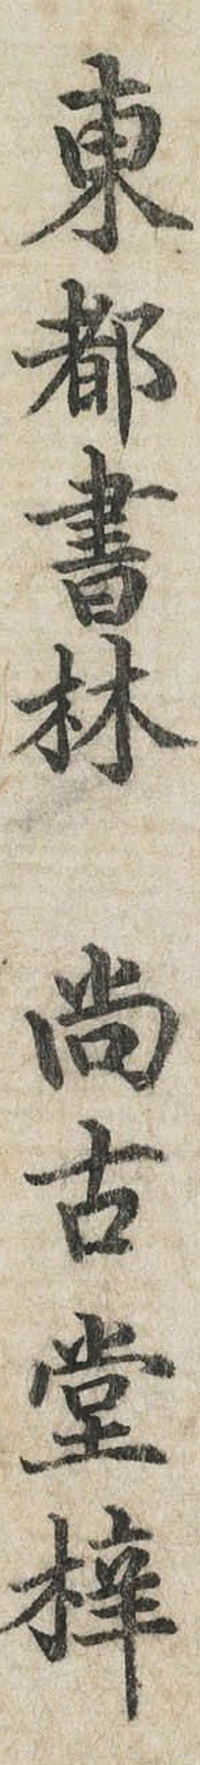東都書林尚古堂梓
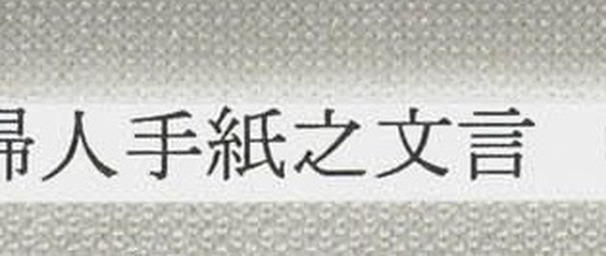婦人手紙之文言叙
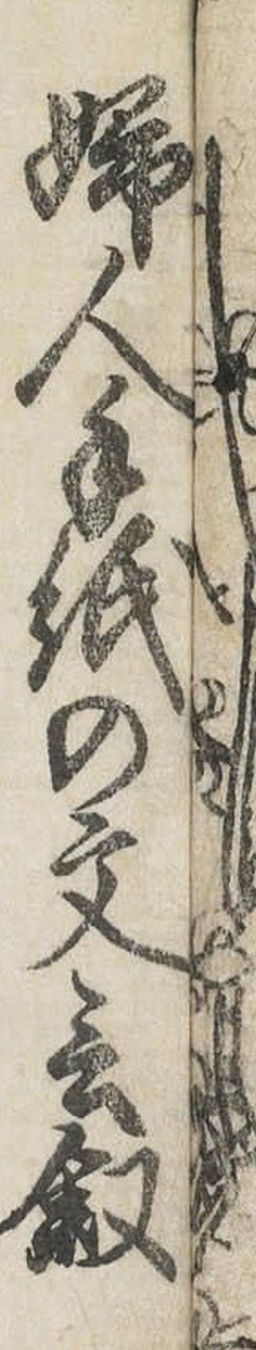婦人手紙之文言叙
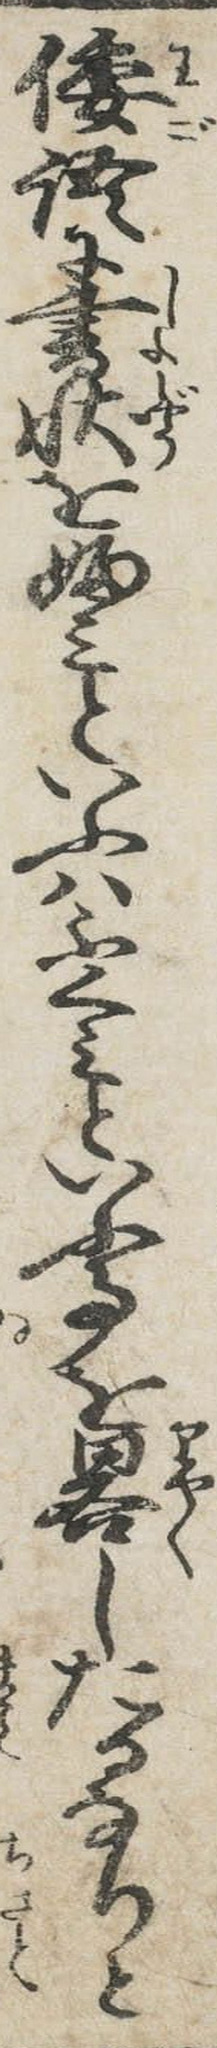倭語に書状をふみといふはふくみといふ事を略したるなりと
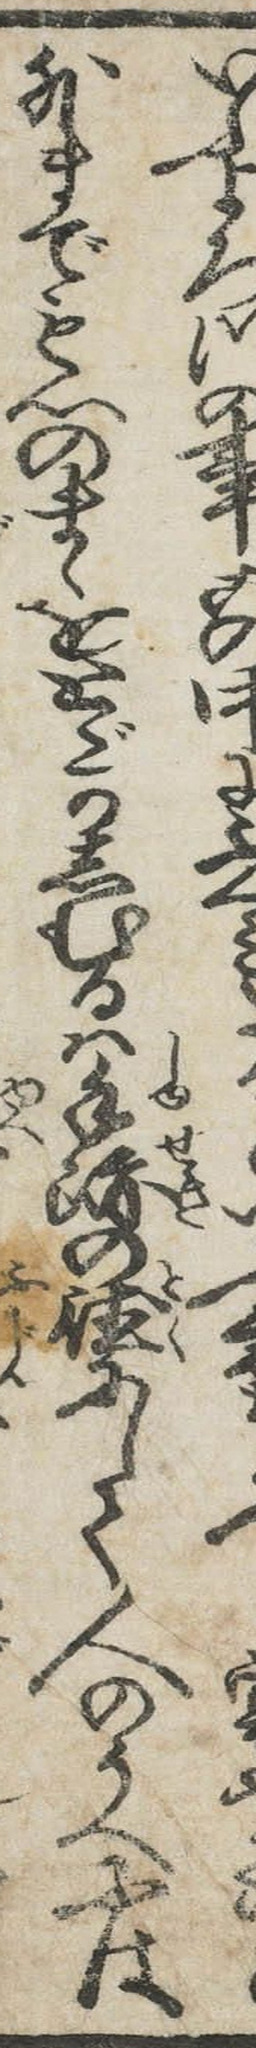外までも心のまゝをとゞかしむるは手跡の徳にして人のうへには
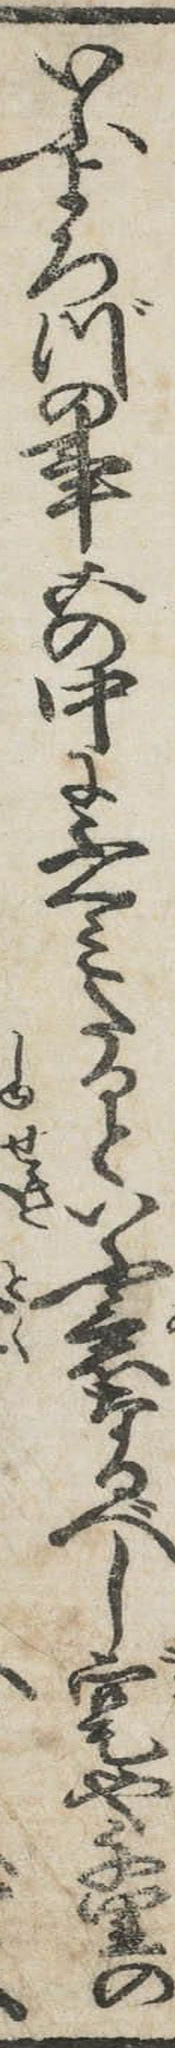いふよろづの事この中にふくみたるといふ意なるべし寔や千里の
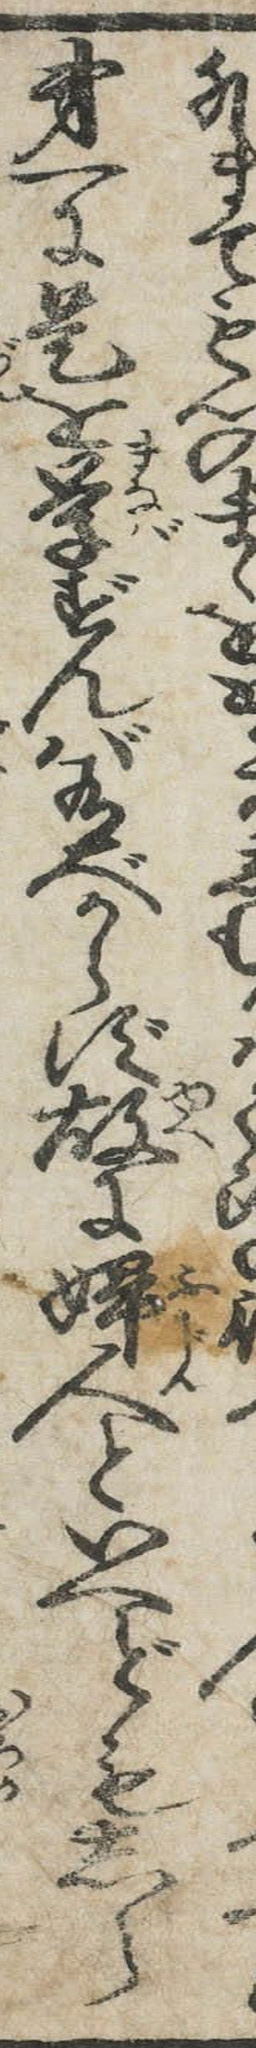第一に是を学ずんば有べからず故に婦人といへどもしら
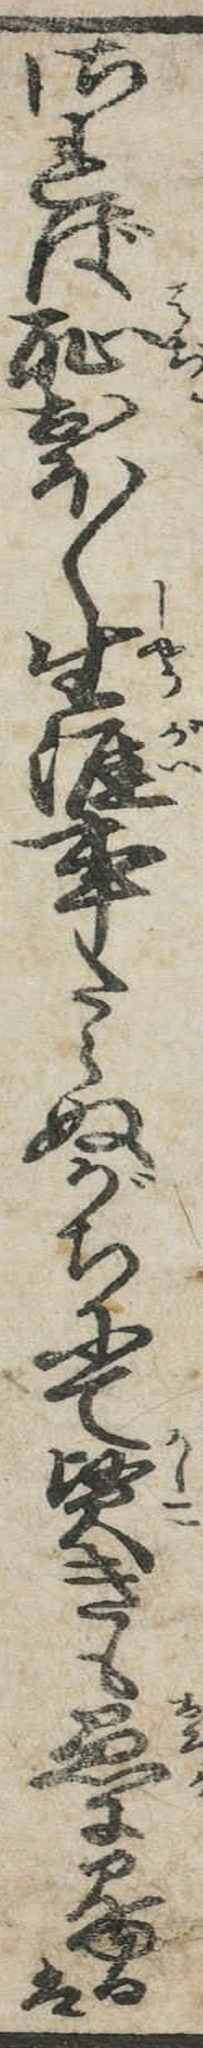されば恥おほく生涯事たらぬがちにて賢きも愚に見ゆるは
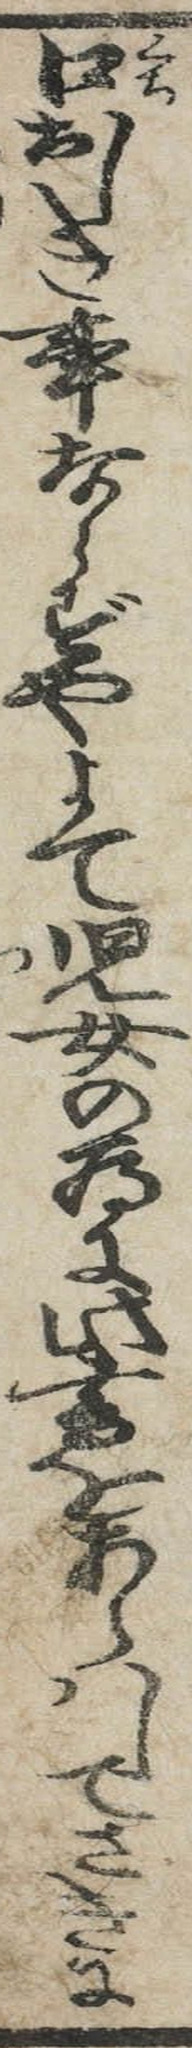口おしき事ならずやよて児女の為に此書をあらはしてさきに
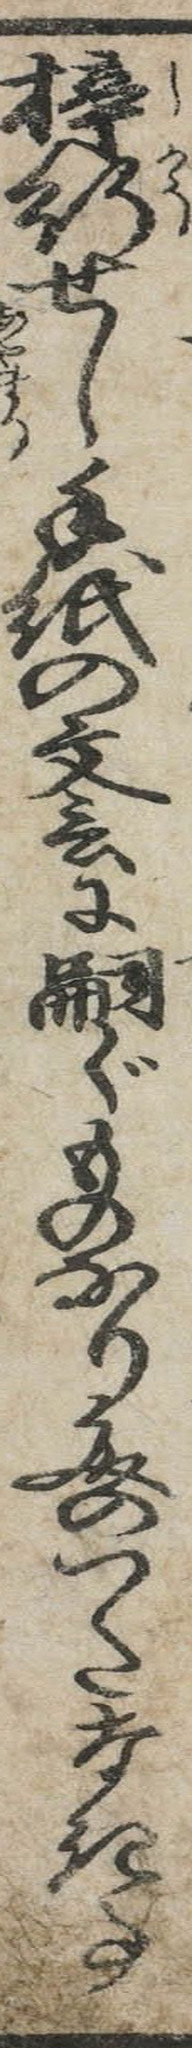梓行せし手紙の文言に嗣ぐものなり文のつたなき事
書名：頭書萬用婦人手紙之文言
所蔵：東京学芸大学教育コンテンツアーカイブ
